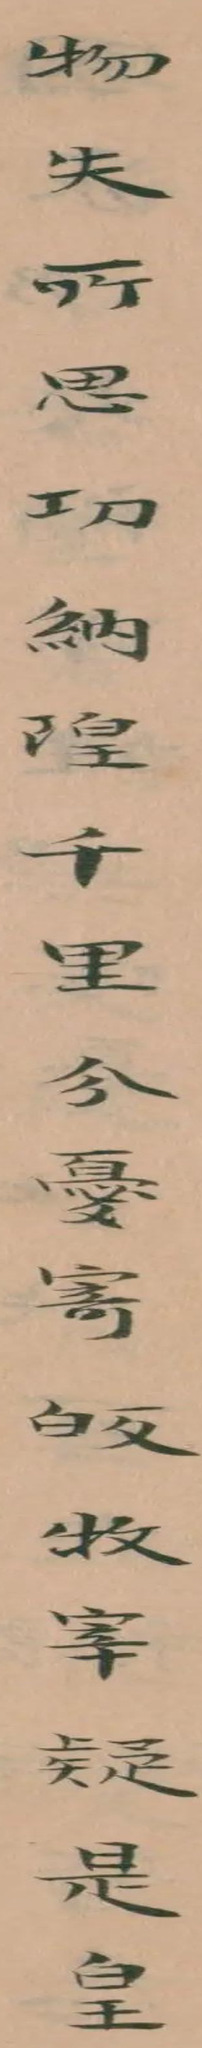物失所思功納隍千里分憂寄帰牧宰疑是皇
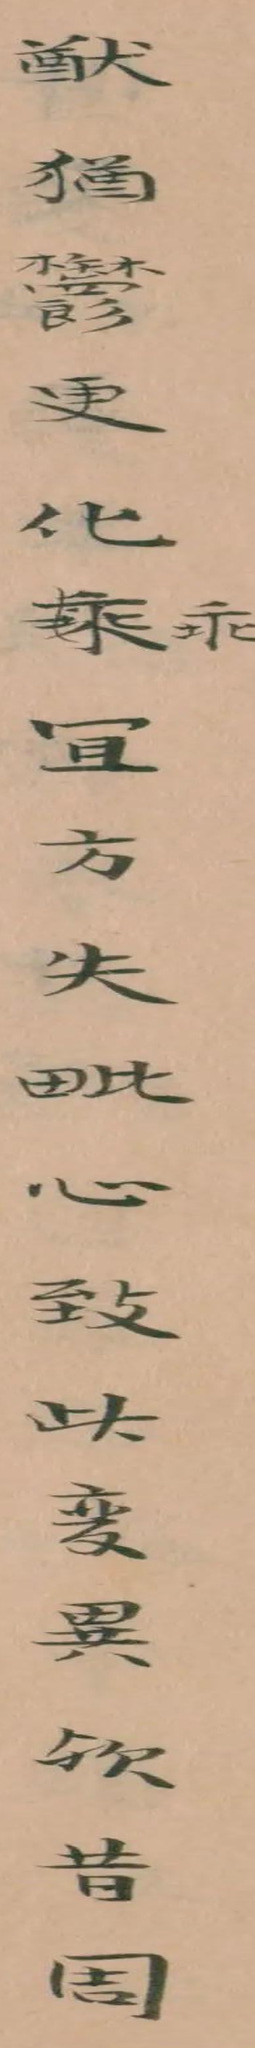猷猶鬱更化乖宜方失毘心致此変異歟昔周
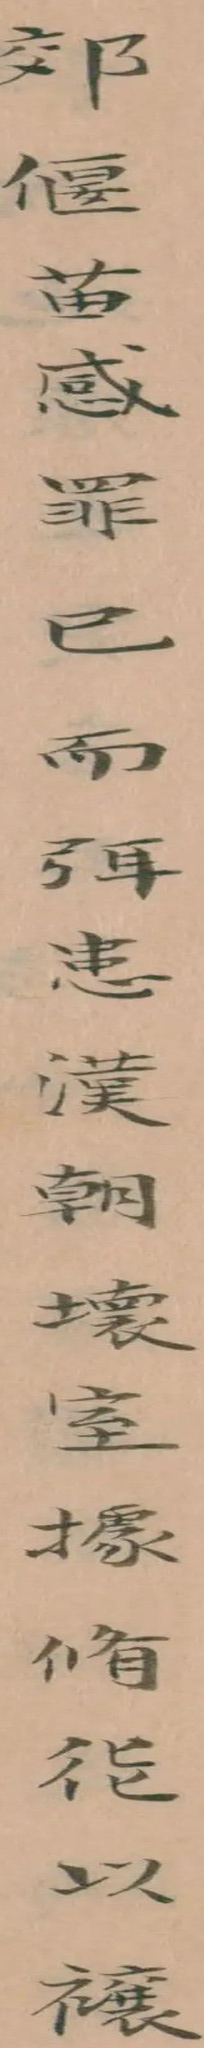郊偃苗感罪已而弭患漢朝壊室拠脩以禳
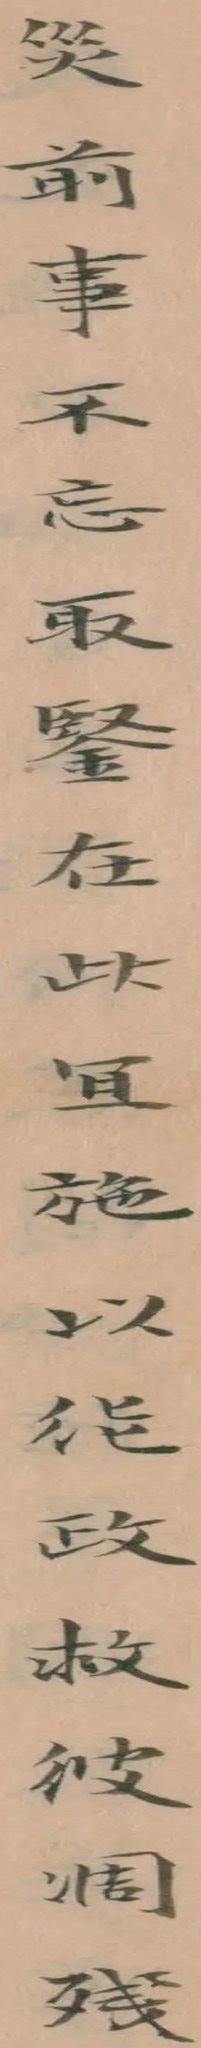災前事不忘取鋻在此宜施以政救彼凋残
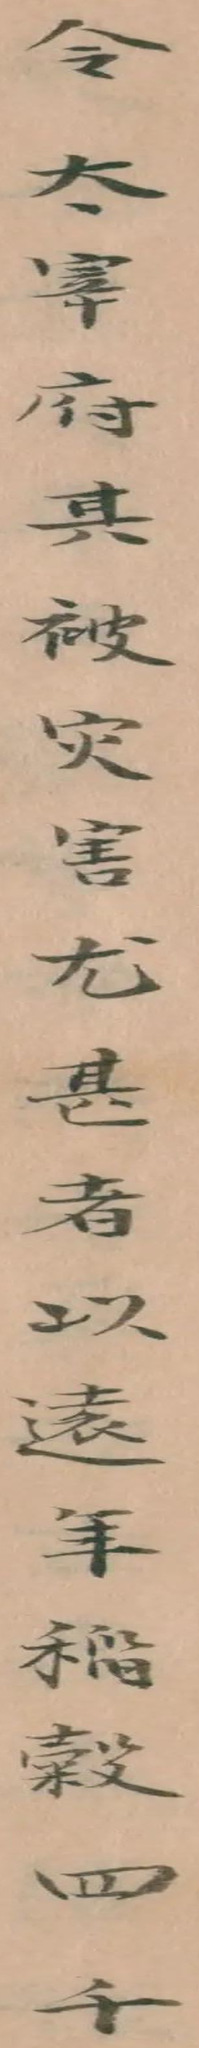令太宰府其被災害尤甚者以遠年稲穀四千
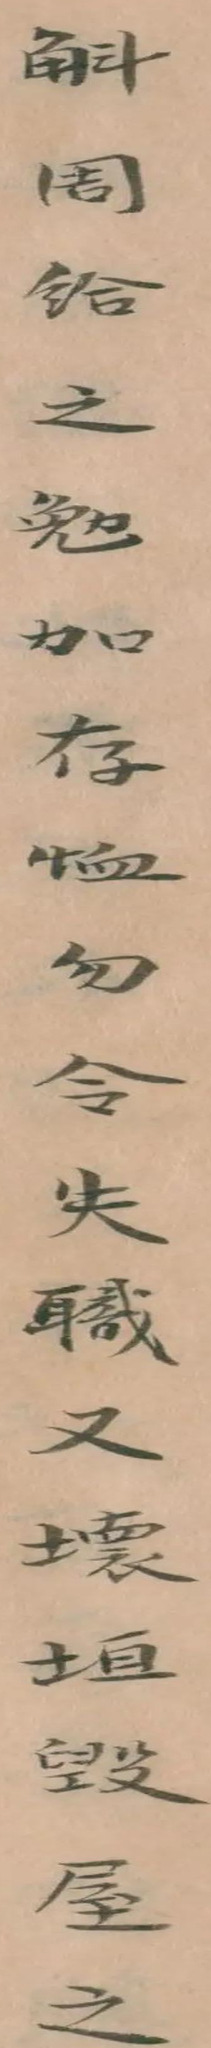斛周給之勉加存恤勿令失職又壊垣毀屋之
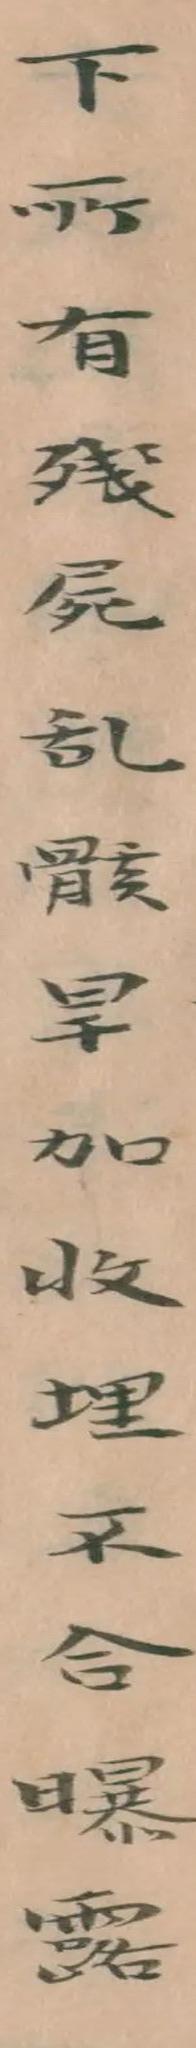下所有残屍乱骸旱加収埋不合曝露
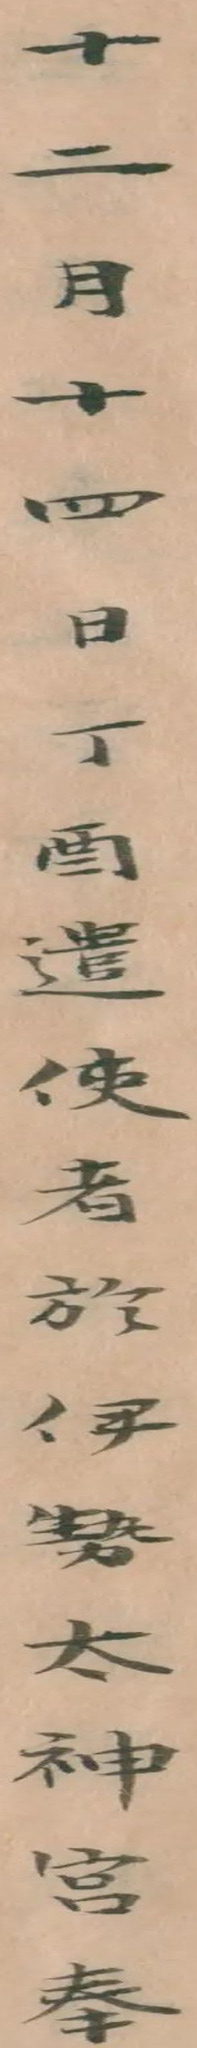十二月十四日丁酉遣使者於伊勢太神宮奉
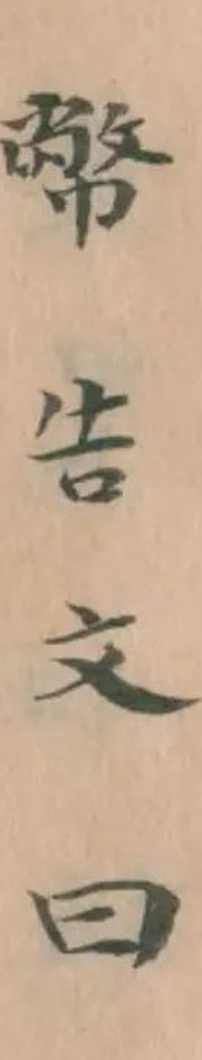幣告文曰

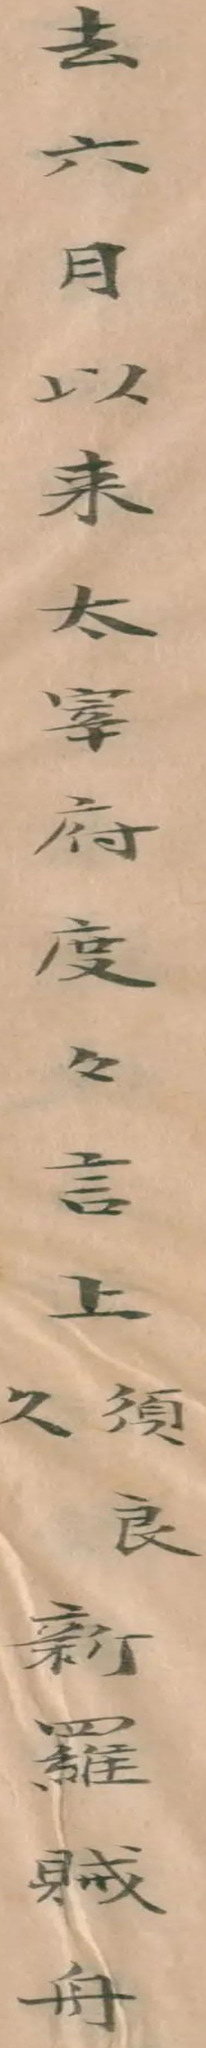去六月以来大宰府度々言上須良久新羅賊舟
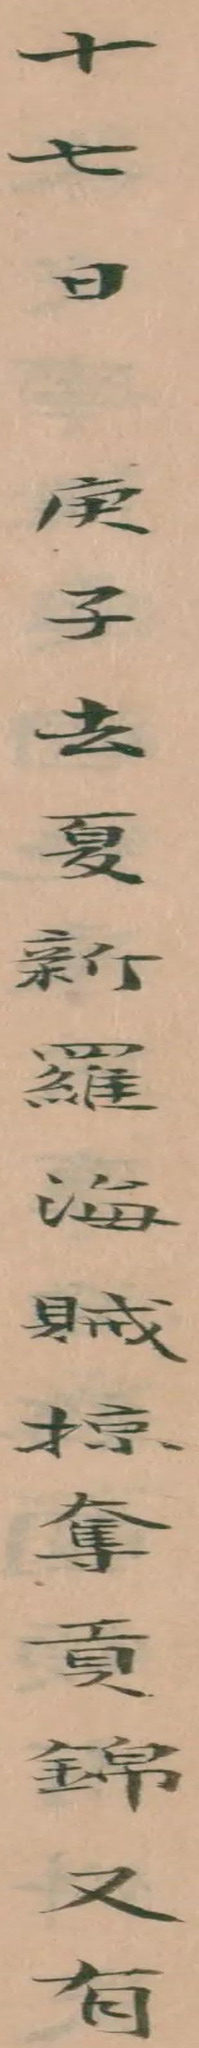十七日庚子去夏新羅海賊掠奪貢錦又有
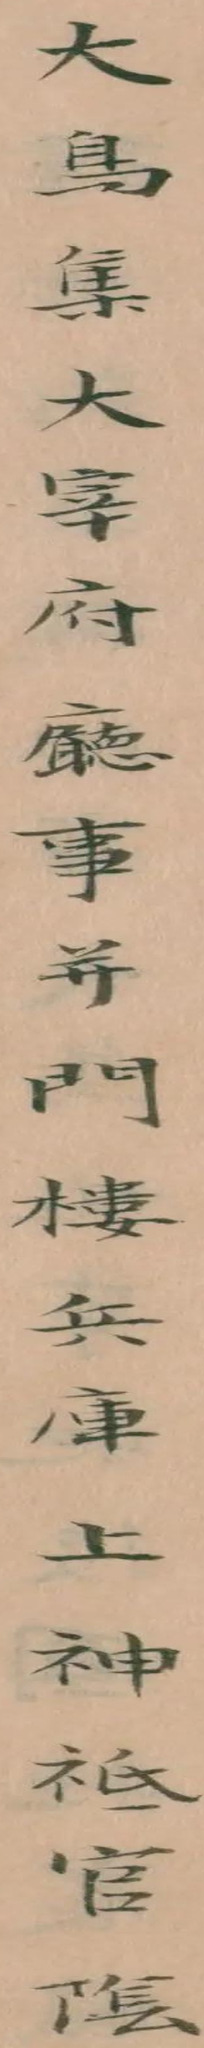大鳥集大宰府庁事并門楼兵庫上神祇官陰
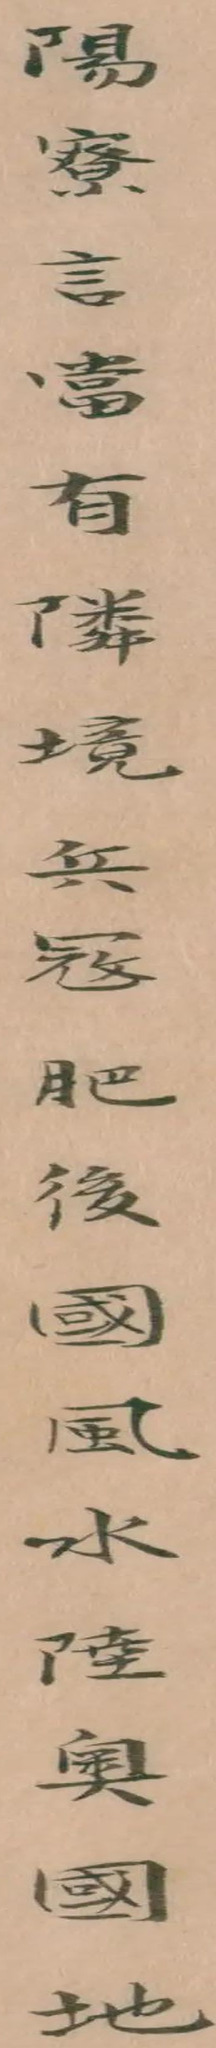陽寮言当有隣境兵冦肥後国風水陸奥国地
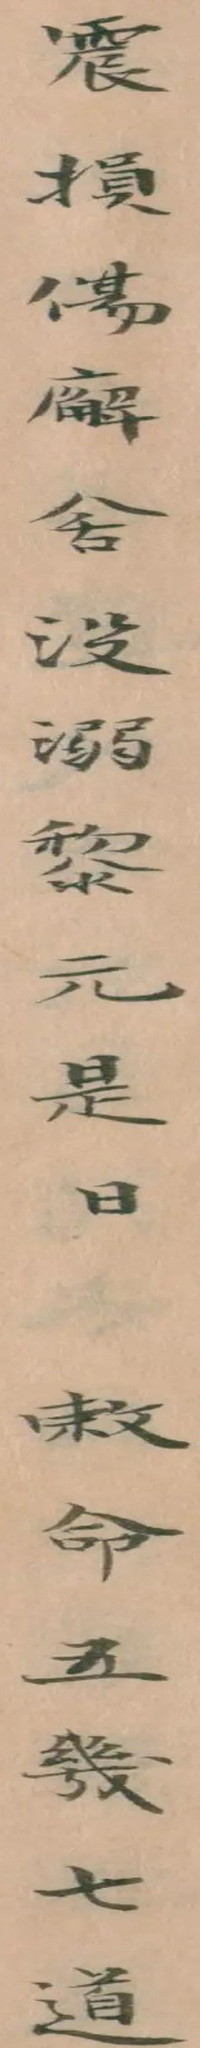震損傷廨舎没溺黎元是日敕命五畿七道
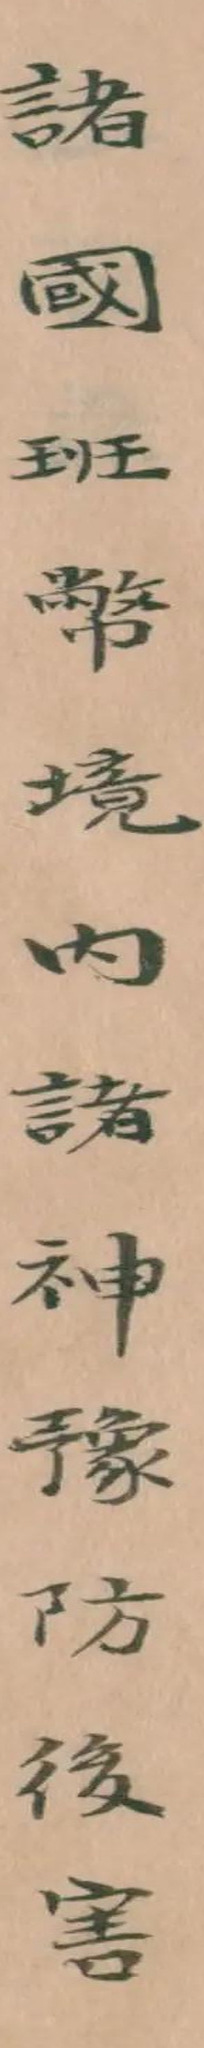諸国班幣境内諸神予防後害
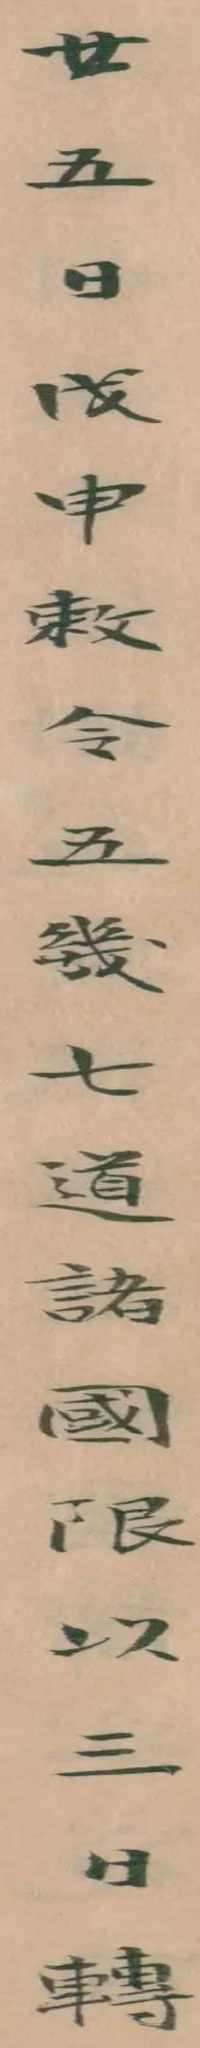廿五日戊申敕令五畿七道諸国限以三日転
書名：地災撮要. 巻5-6(地震之部)
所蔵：国立国会図書館 National Diet Library, JAPAN
